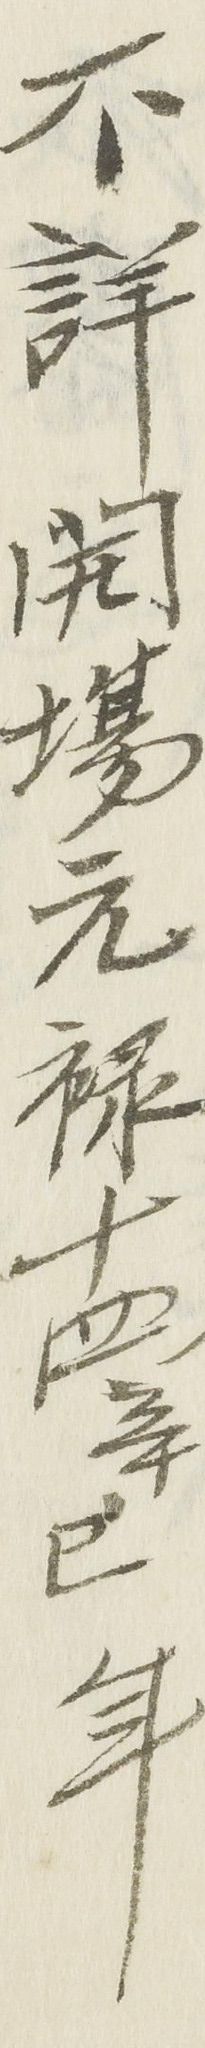不詳開場元禄十四辛巳年
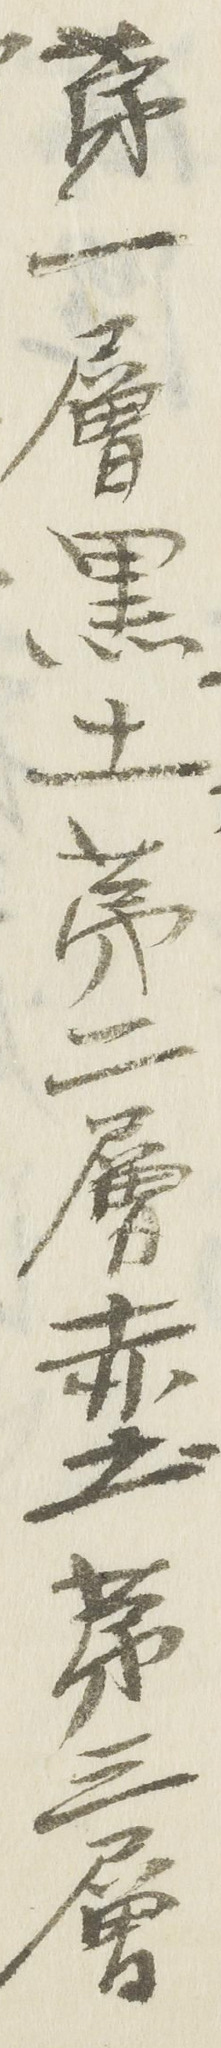第一層黒土第二層赤土第三層
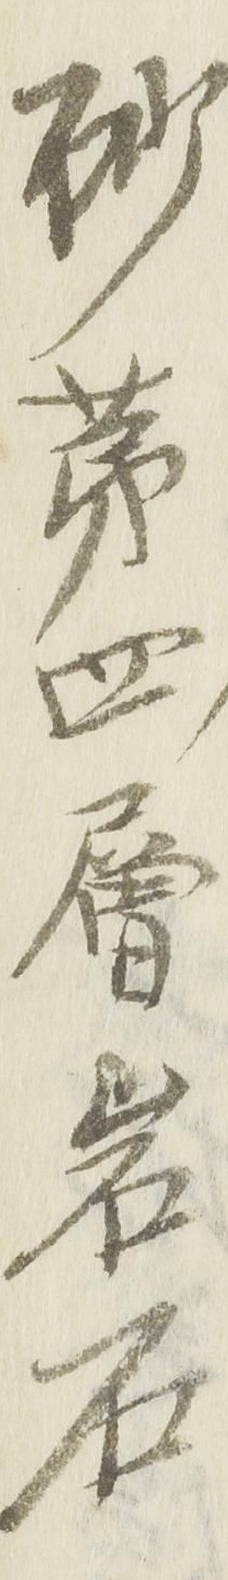砂第四層岩石

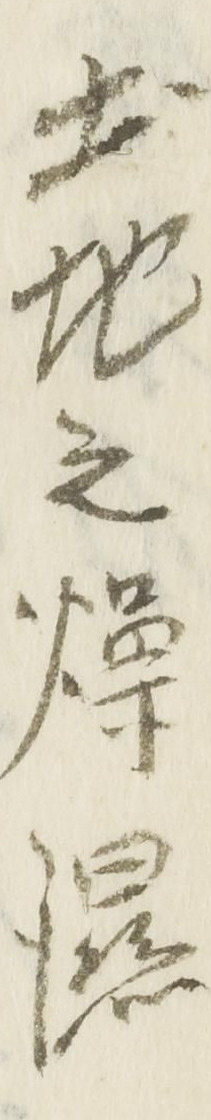土地之燥湿
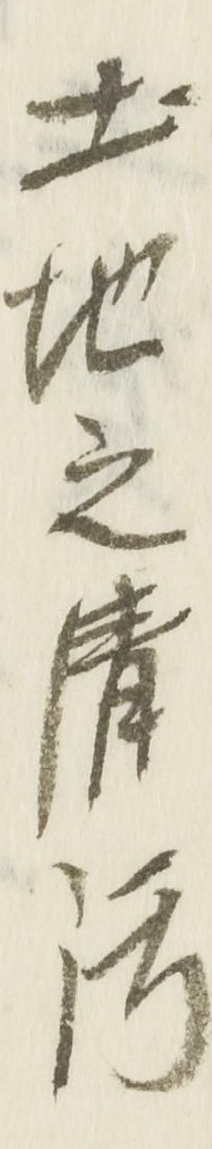土地之清汚
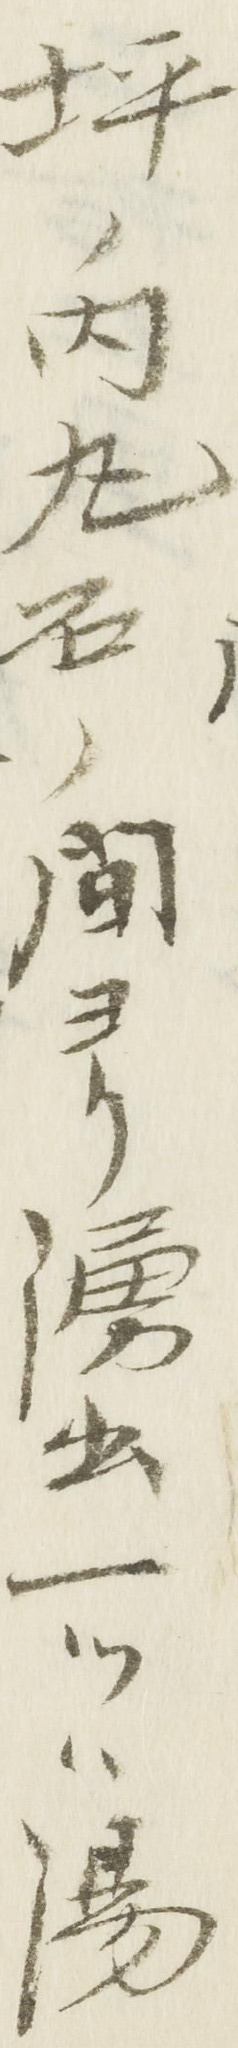坪之内石ノ間ヨリ湧出一ツハ湯
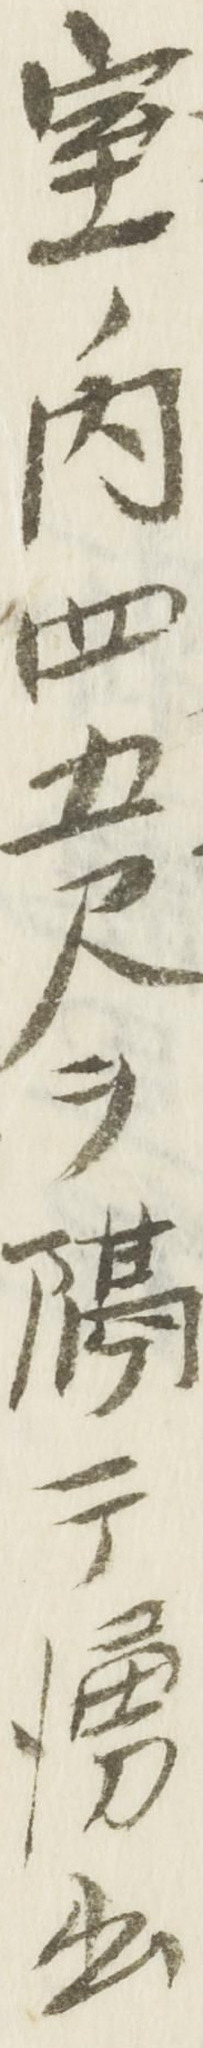室ノ内四五尺ヲ隔テ湧出
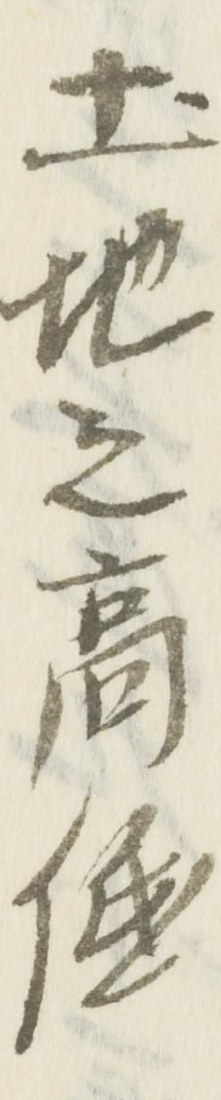土地之高低
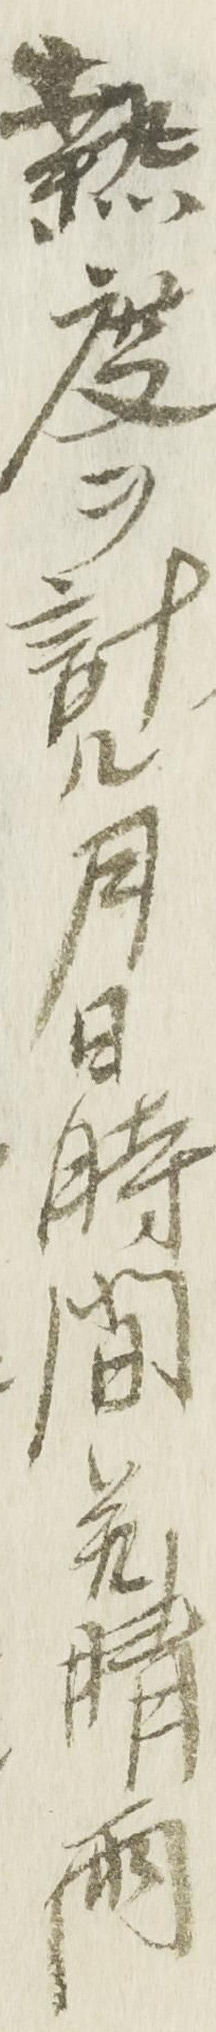熱度ヲ計ル月日時間幷晴雨
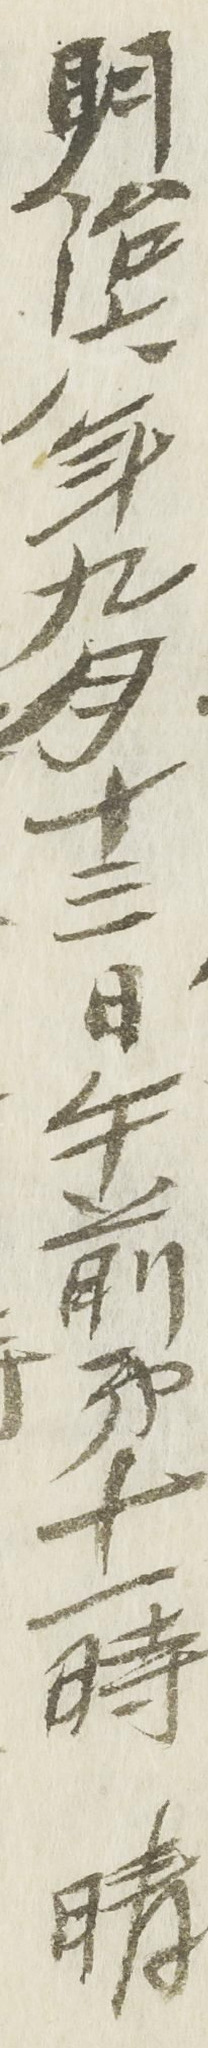明治六年九月十三日午前第十一時晴
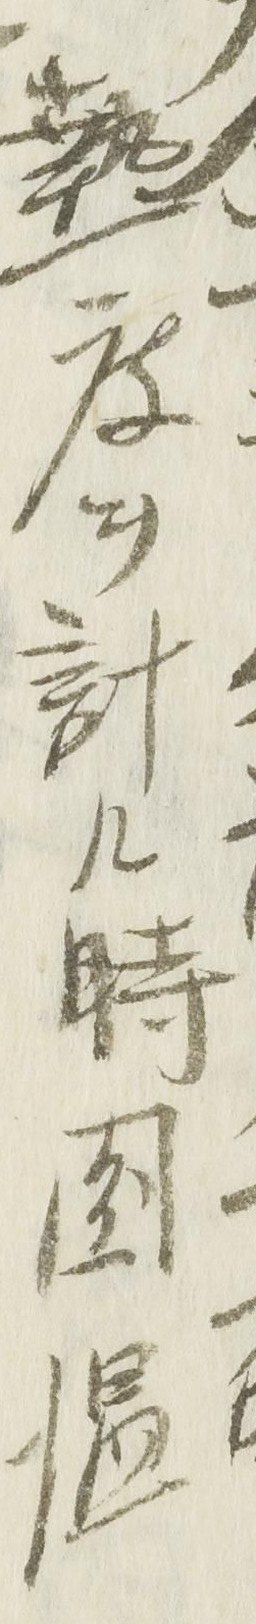熱度ヲ計ル時分温
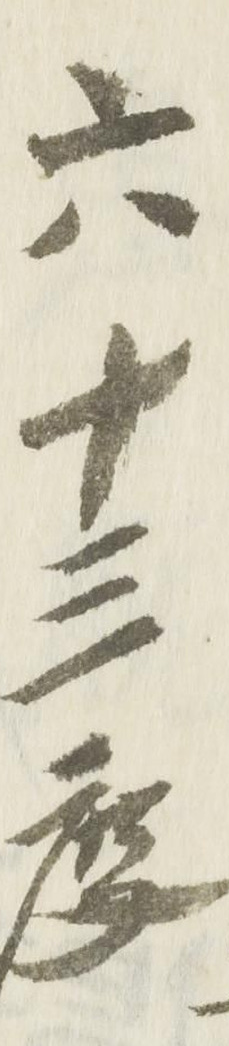六十三度
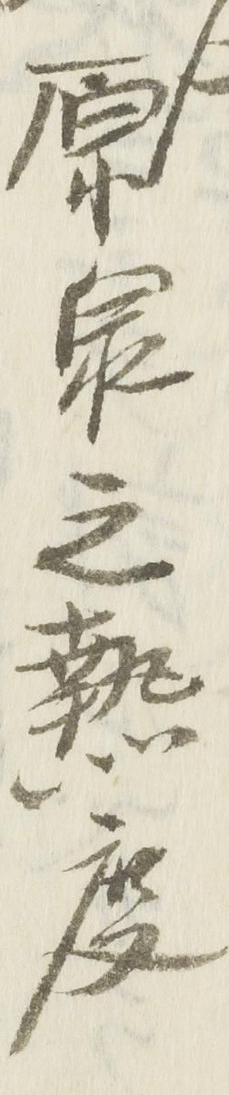原泉之熱度
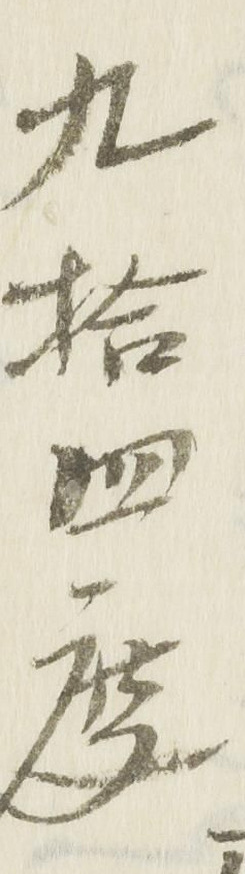九拾四度
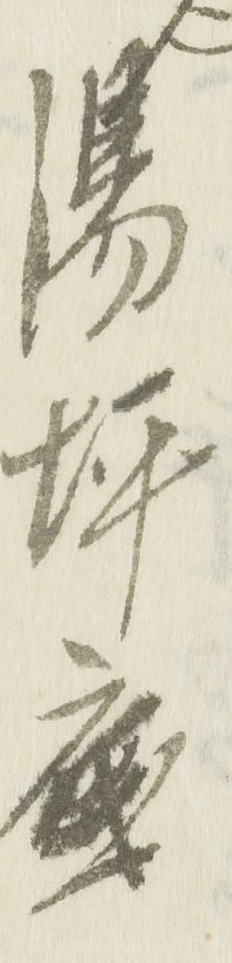湯坪底
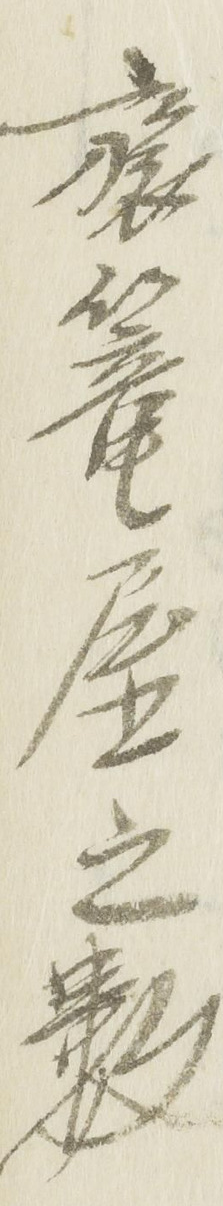旅籠屋之数
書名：温冷泉試験表
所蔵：東京大学地震研究所図書室 Earthquake Research Institute Library, The University of Tokyo, JAPAN
